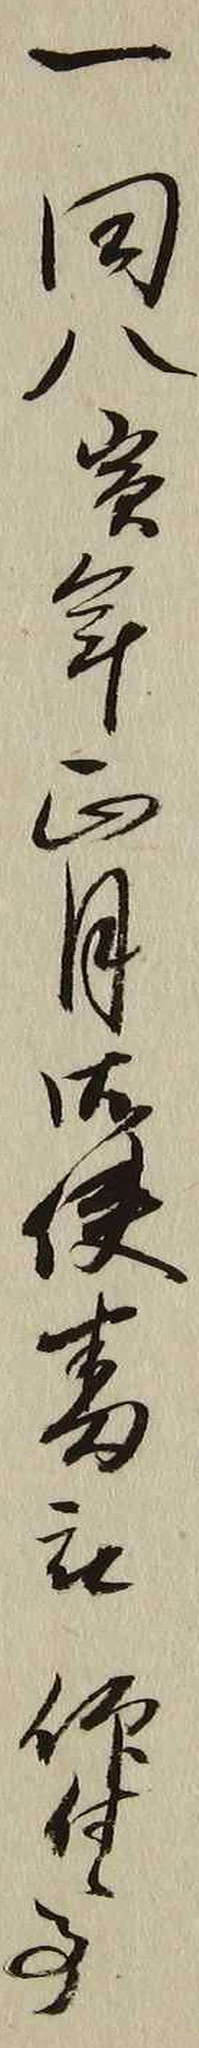一同八寅年正月御使番被仰付候事
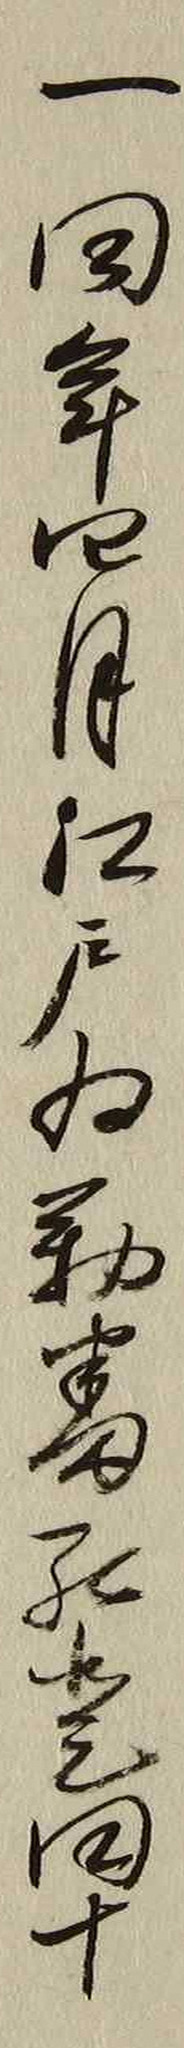一同年四月江戸為勤番罷登同十
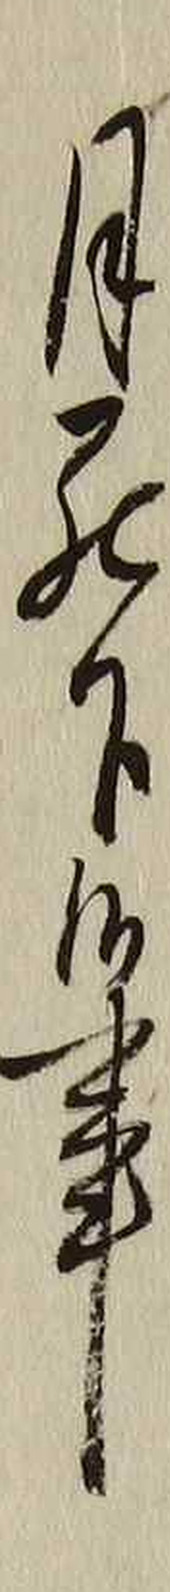月罷下候事
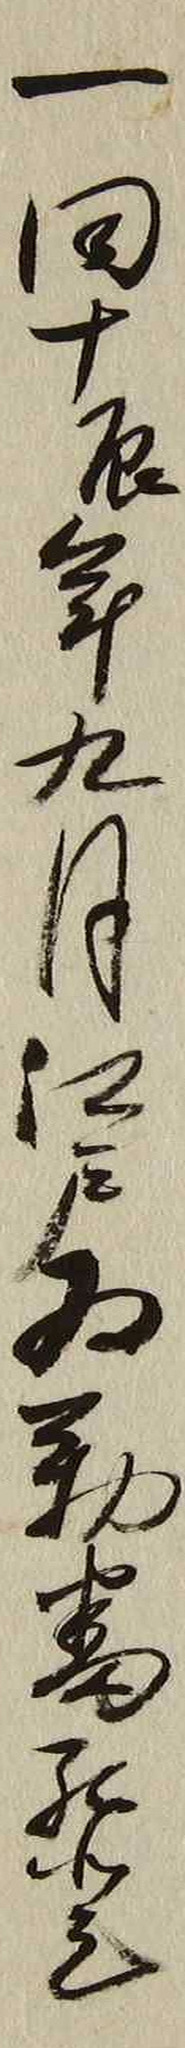一同十辰年九月江戸為勤番罷登
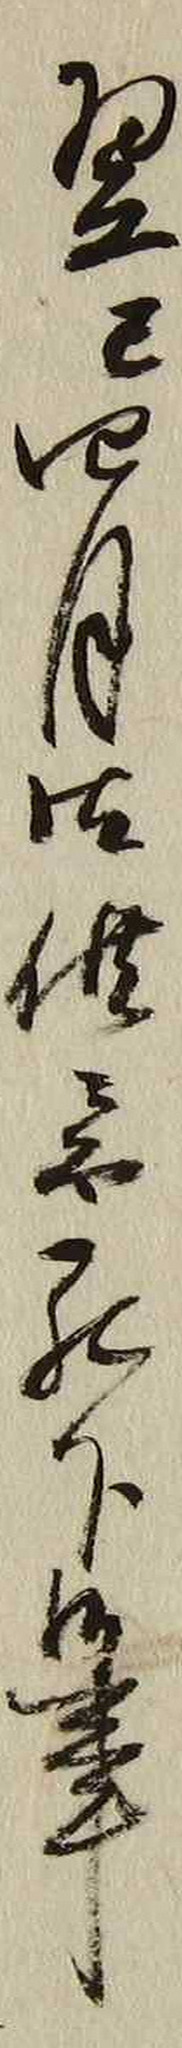翌巳四月御供ニ而罷下候事
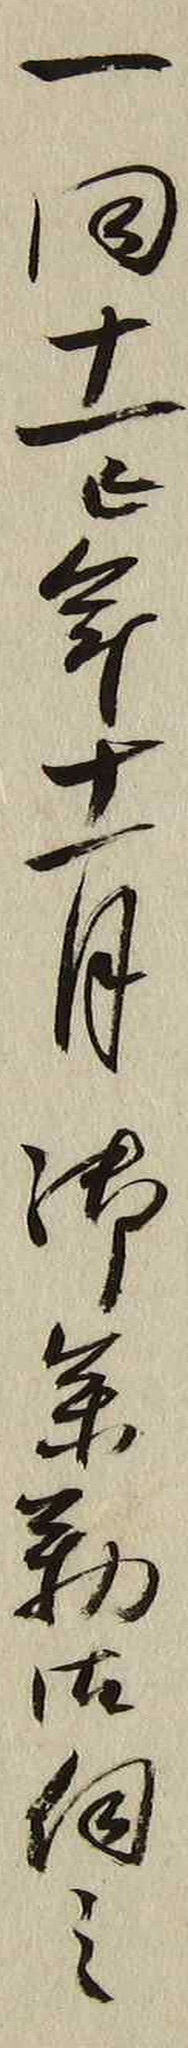一同十一巳年十一月御参勤御伺之
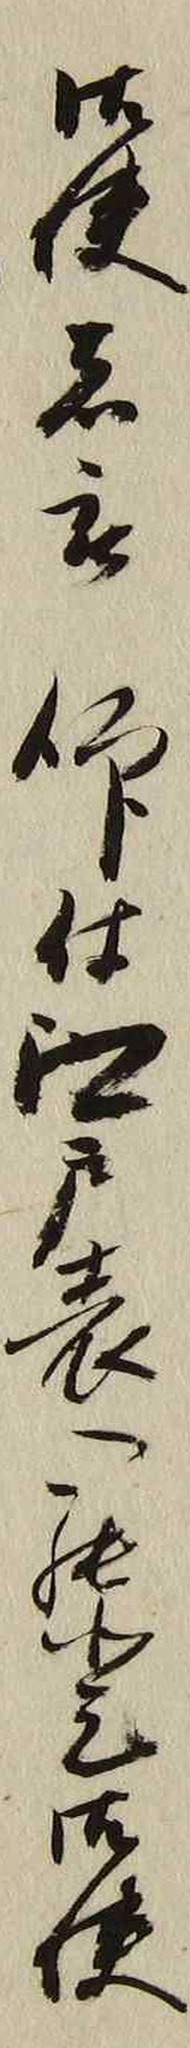御使者被仰付江戸表へ罷登御使
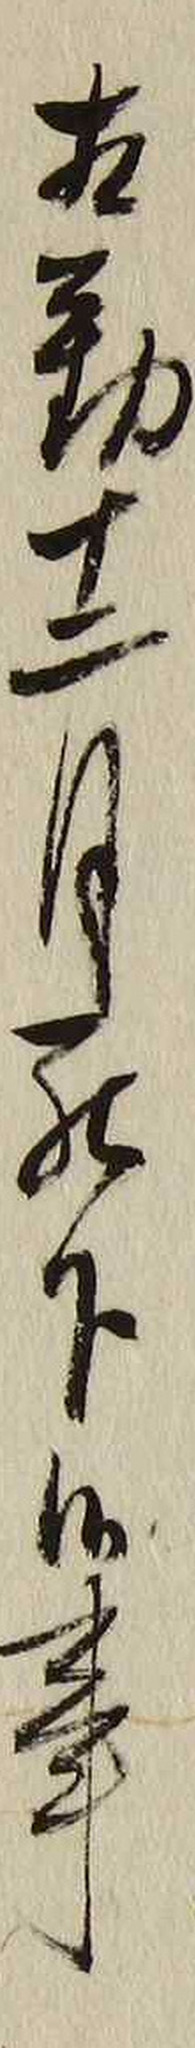相勤十二月罷下候事
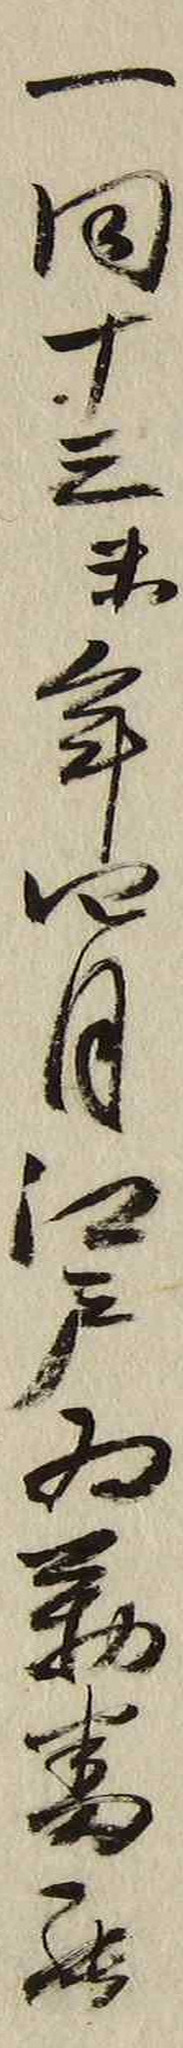一同十三未年四月江戸為勤番罷
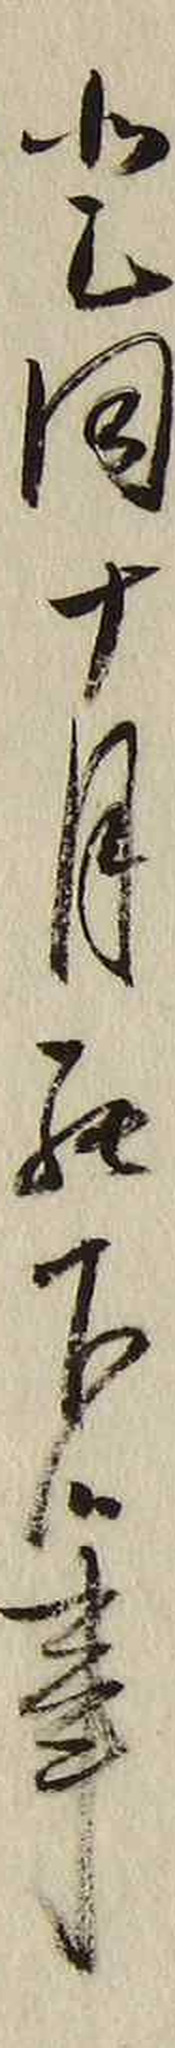登同十月罷下候事
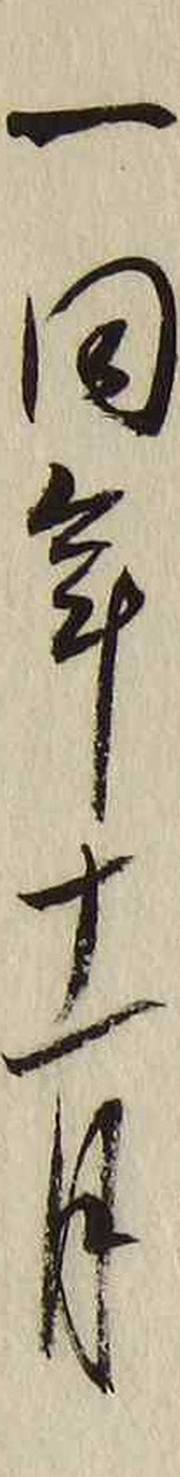一同年十一月

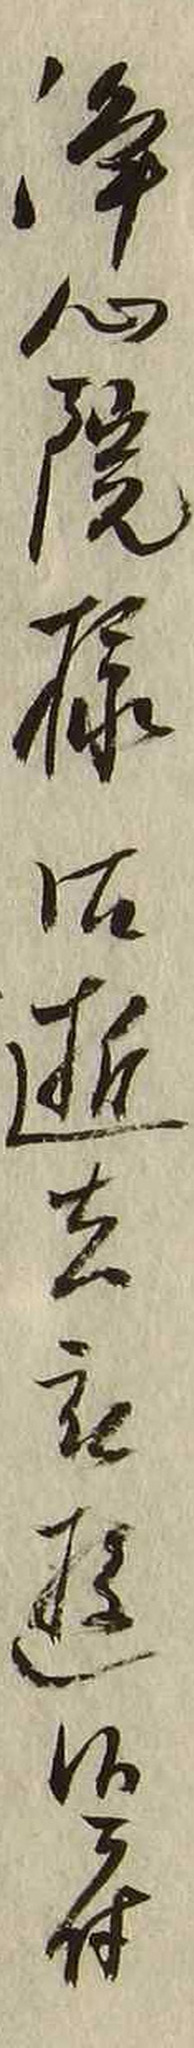浄心院様御逝去被遊候ニ付
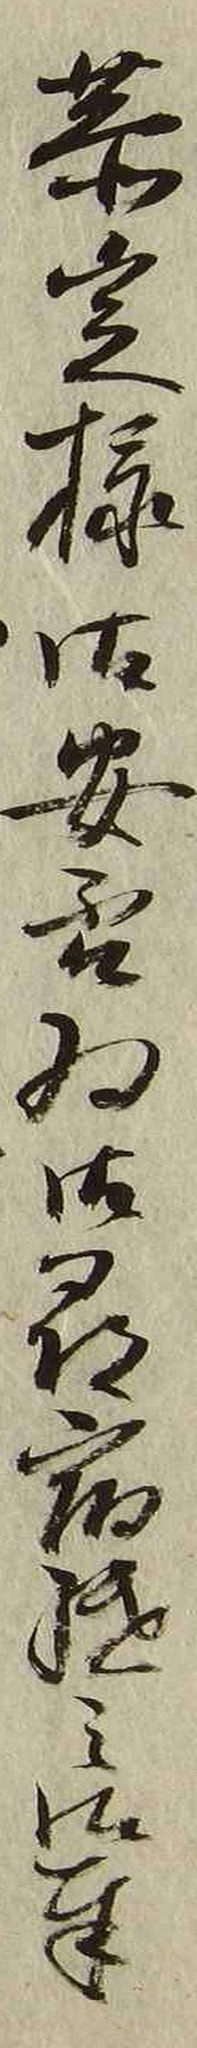恭定様御安否為御尋宿継之御奉
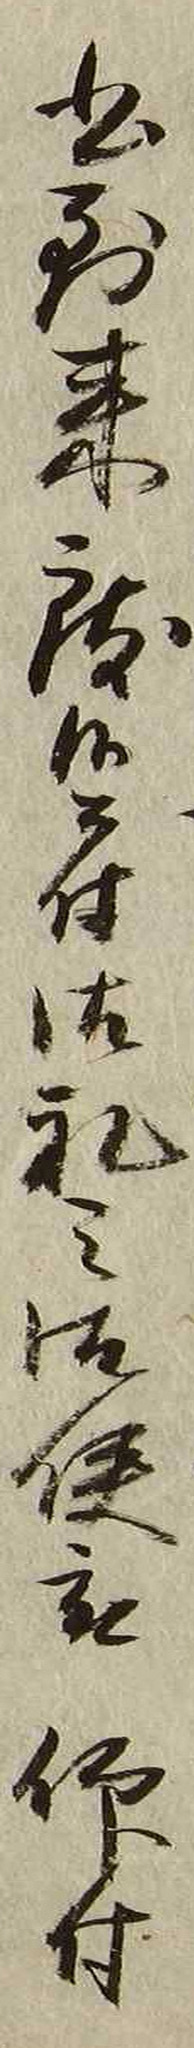書到来致候ニ付御礼之御使被仰付
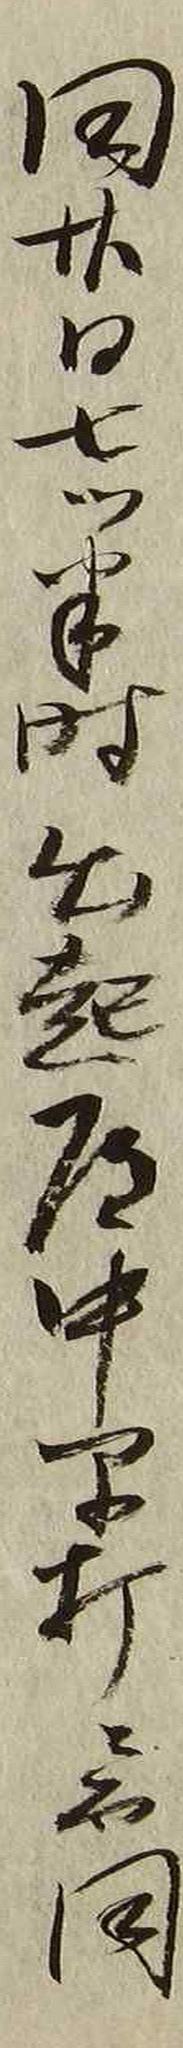同廿日七半ツ時出起道中早打ニ而同
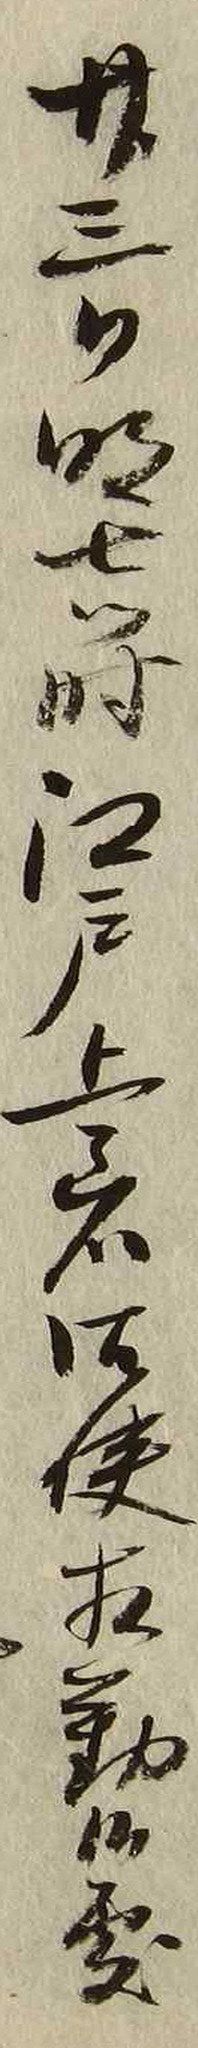廿三日明七ツ時江戸上着御使相勤候処
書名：諸士系譜　巻之356　す之部6
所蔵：会津若松市立会津図書館
